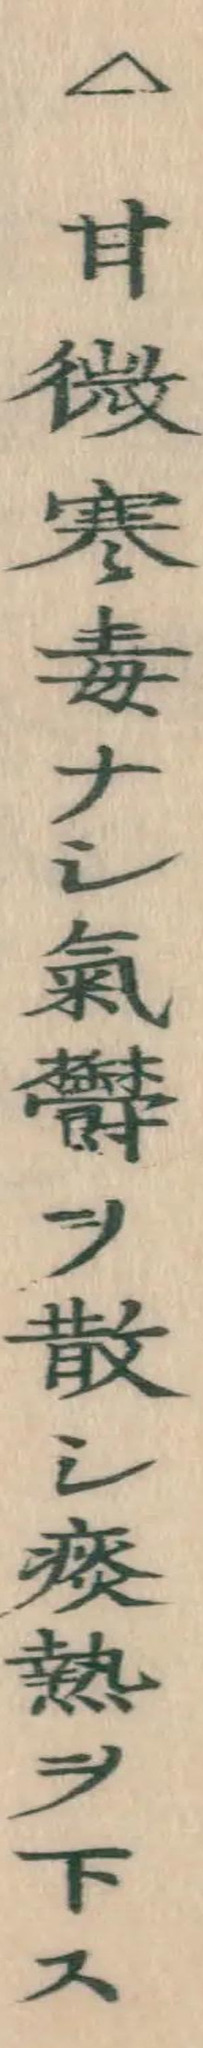△甘微寒毒ナシ気鬱ヲ散シ痰熱ヲ下ス

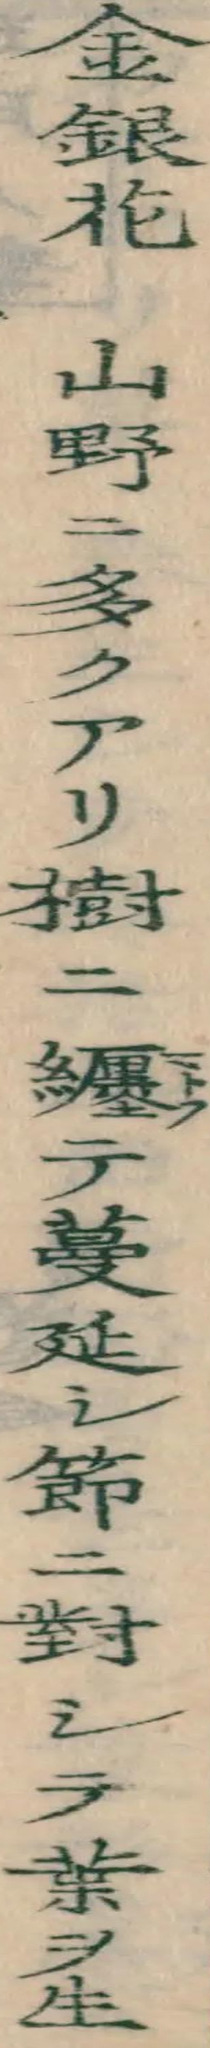金銀花山野ニ多クアリ樹ニ纏テ蔓延シ節ニ対シテ葉ヲ生
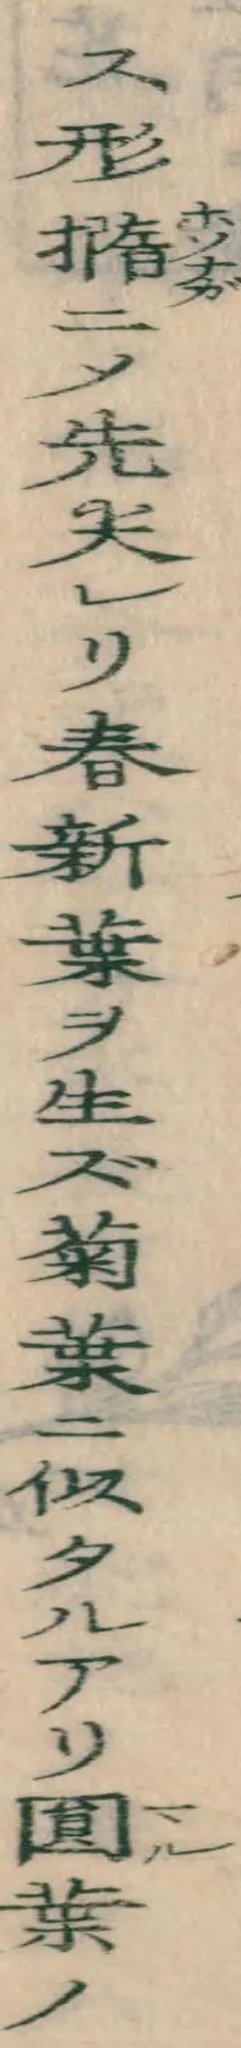ス形楕にして先尖レリ春新葉ヲ生ズ菊葉ニ似タルアリ円葉ノ
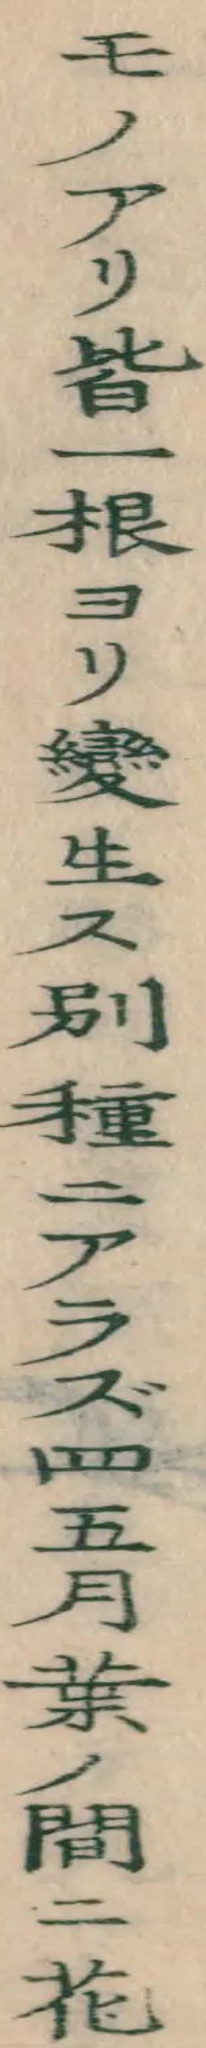モノアリ皆一根ヨリ変生ス別種ニアラズ四五月葉ノ間ニ花
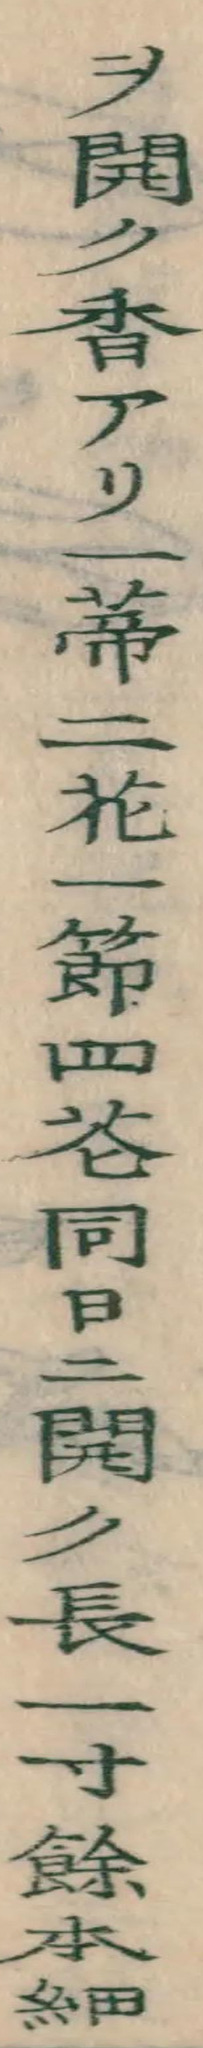ヲ開ク香アリ一蒂二花一節四花同日ニ開ク長一寸余本細
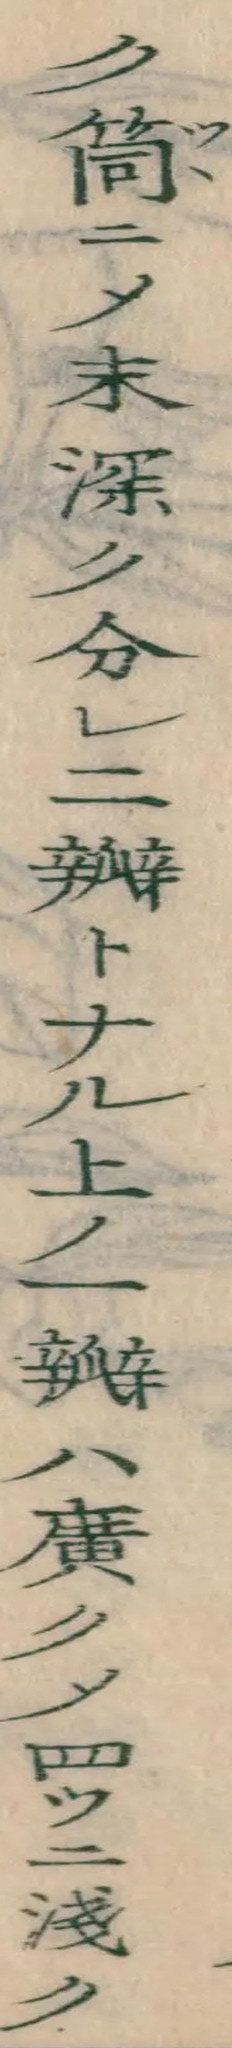ク筒ニシテ末深ク分レ二弁トナル上ノ一弁ハ広クシテ四ツニ浅ク
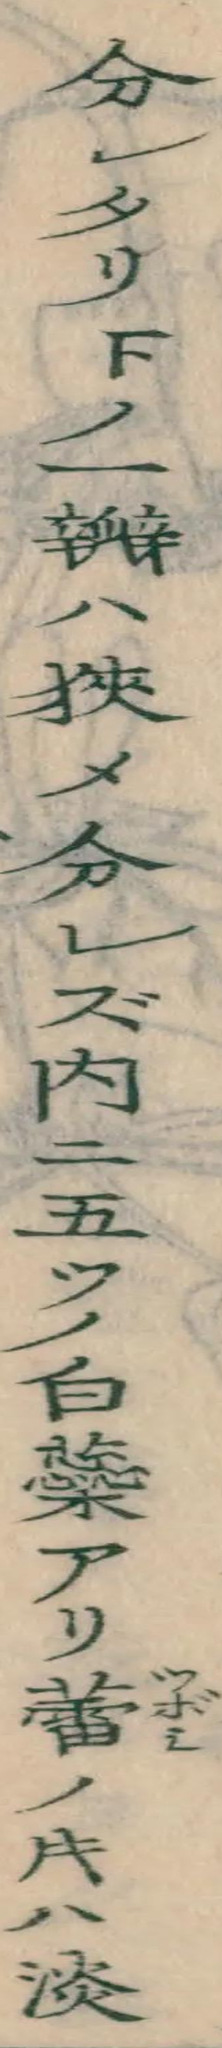分レタリ下ノ一弁ハ狭シテ分レズ内ニ五ツノ白蕊アリ蕾ノトキハ淡
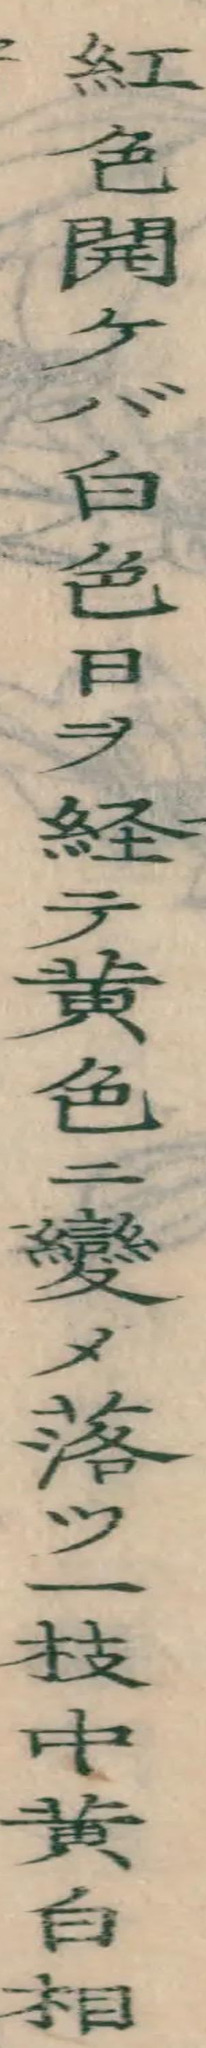紅色開ケバ白色日ヲ経テ黄色ニ変シテ落ツ一枝中黄白相
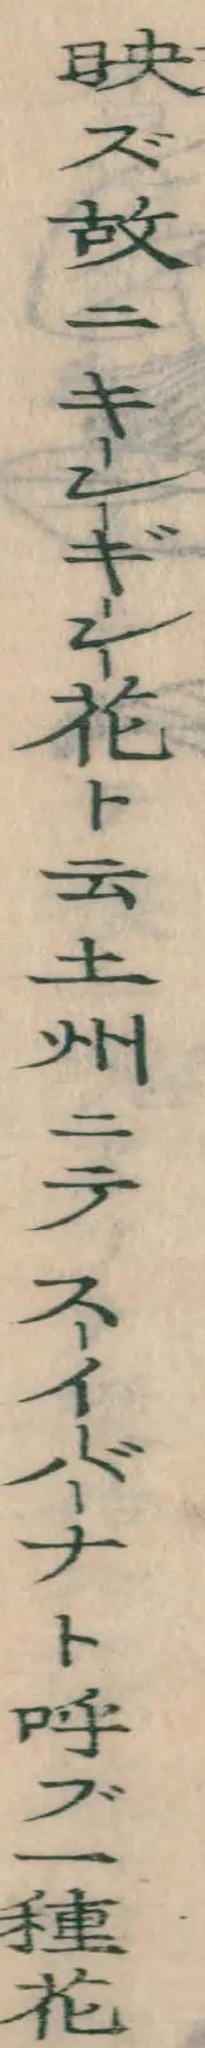映ズ故ニキ-ン-ギ-ン-花ト云土州ニテス-イ-バ-ナト呼ブ一種花
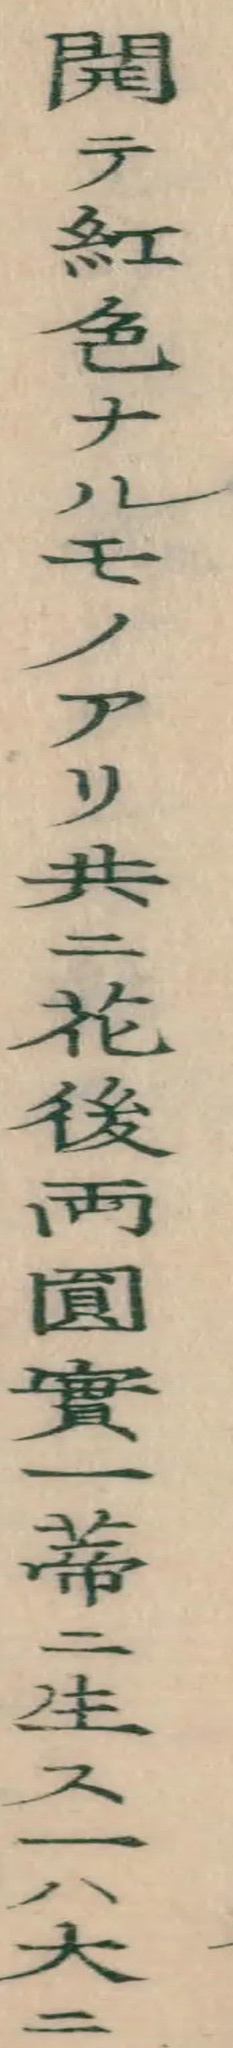開テ紅色ナルモノアリ共ニ花後両円実一蒂ニ生ス一ハ大ニ
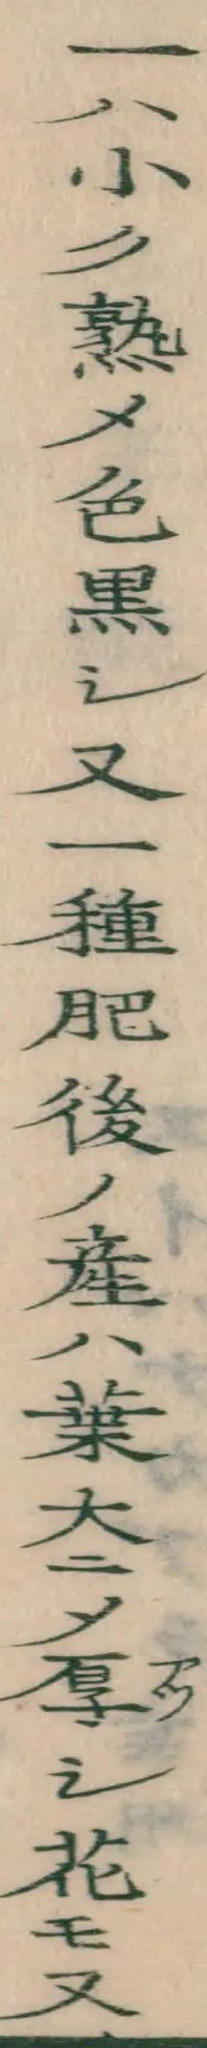一ハ小ク熟シテ色黒シ又一種肥後ノ産ハ葉大ニシテ厚シ花モ又
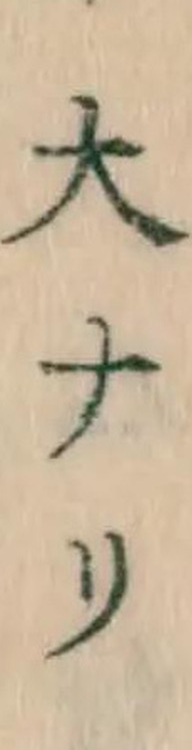大ナリ
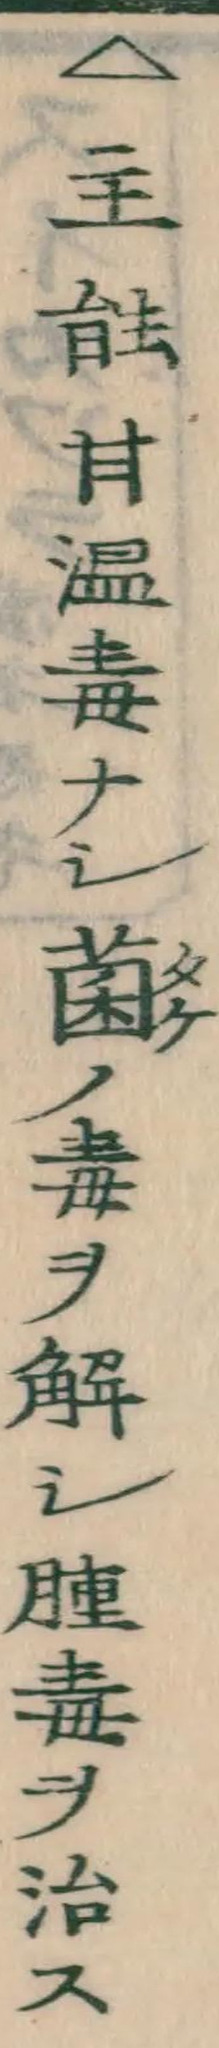△主能甘温毒ナシ菌ノ毒ヲ解シ腫毒ヲ治ス

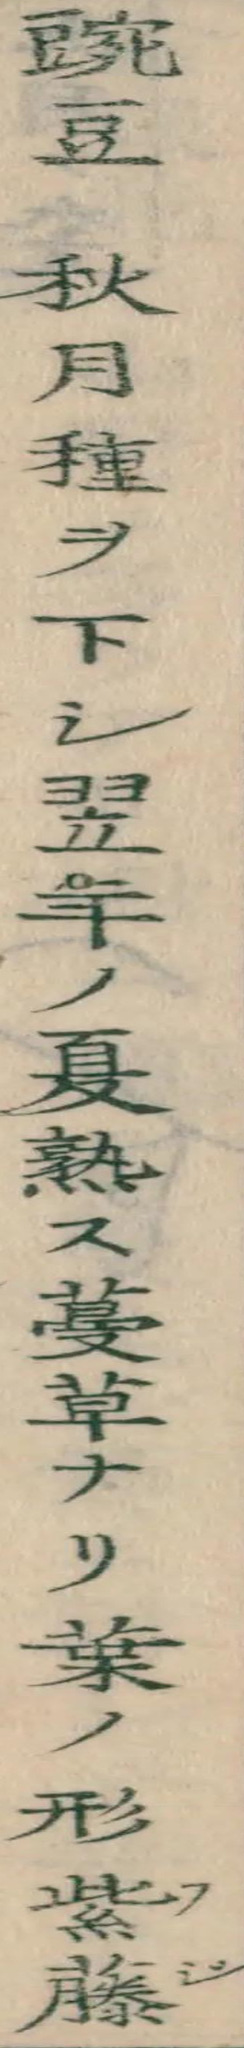豌豆秋月種ヲ下シ翌年ノ夏熟ス蔓草ナリ葉ノ形紫藤
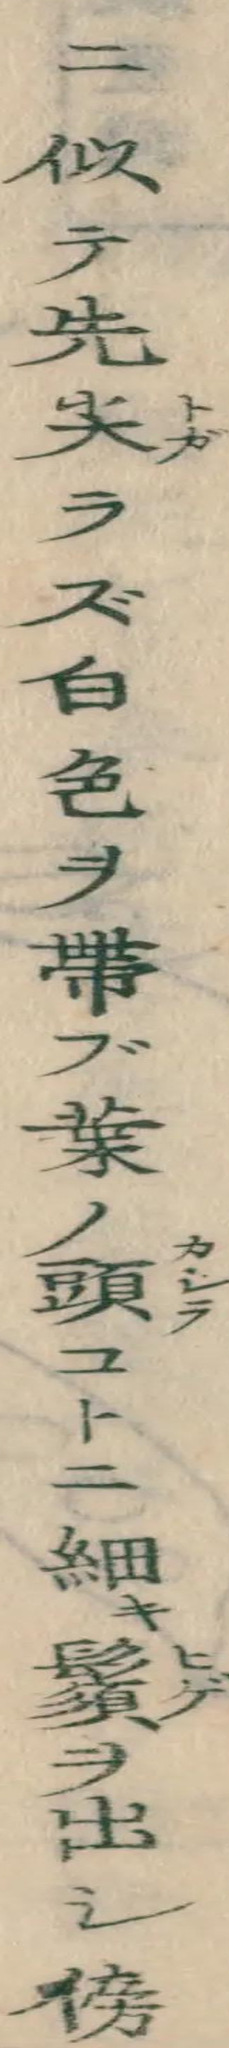ニ似テ先尖ラズ白色ヲ帯ブ葉ノ頭コトニ細鬚ヲ出シ傍
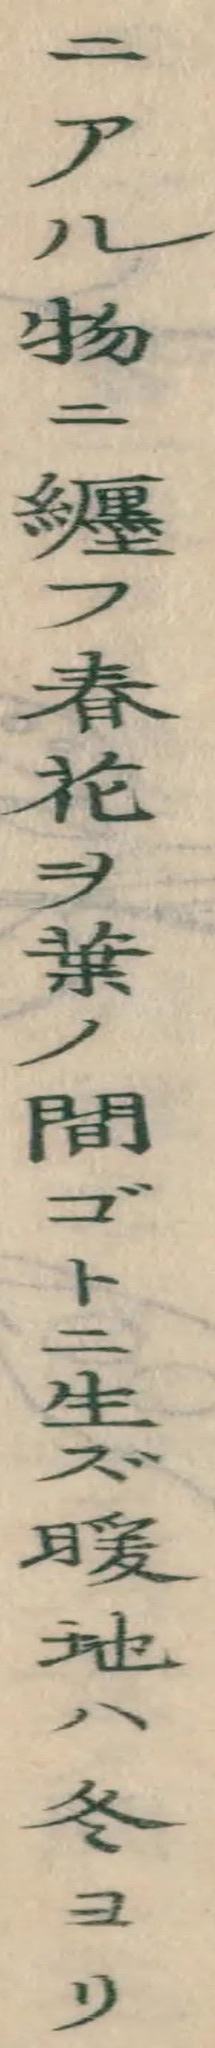ニアル物ニ纏フ春花ヲ葉ノ間ゴトニ生ズ暖地ハ冬ヨリ
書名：これこれ草 2巻. [2]
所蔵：国立国会図書館 National Diet Library, JAPAN
